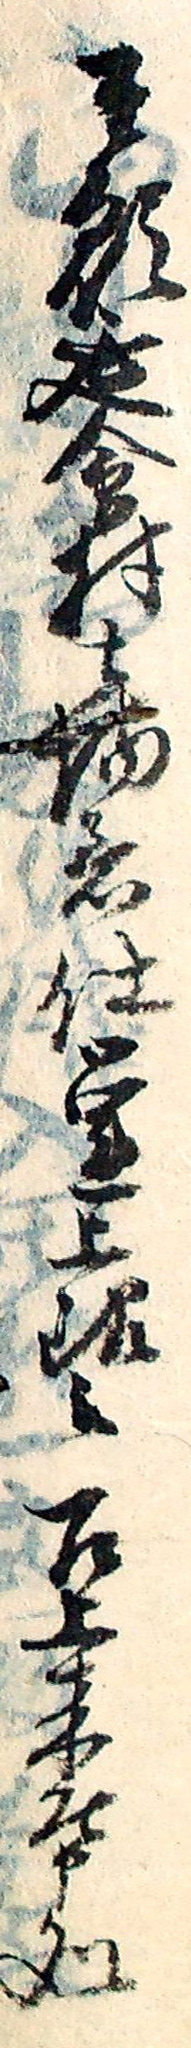奉願延命村土場着仕御運上銀被召上来居申処
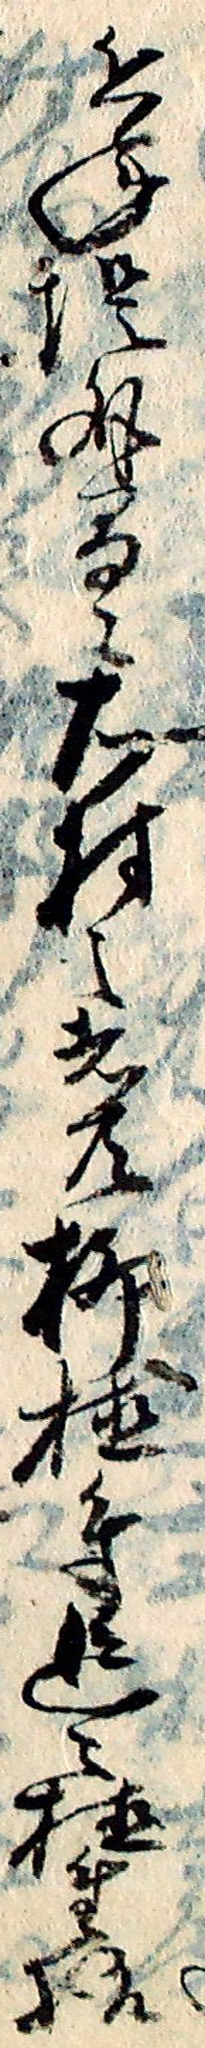近年堤外間に右村之者共柳植付追々植付候様
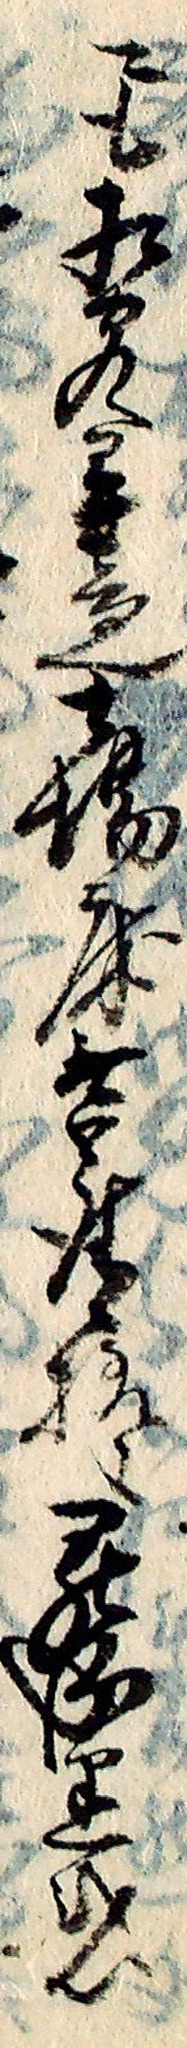にも相聞へ畢竟土場床無御座候様に罷成迷惑
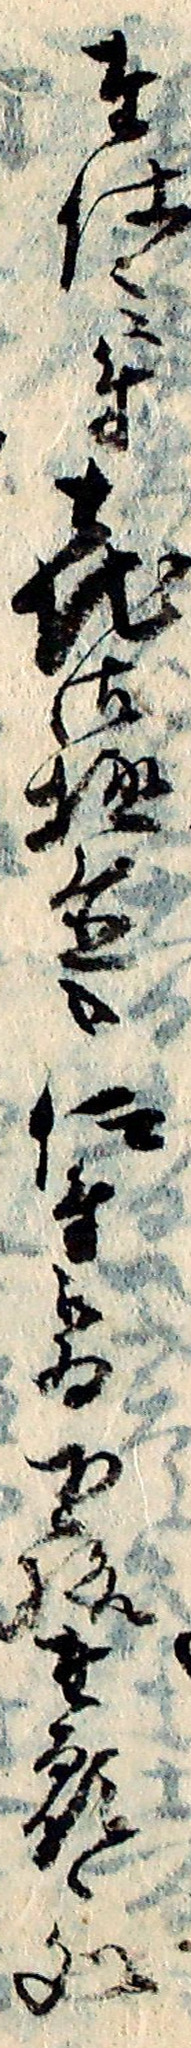奉仕候に付土地御極置被仰付被為下候様奉願候処
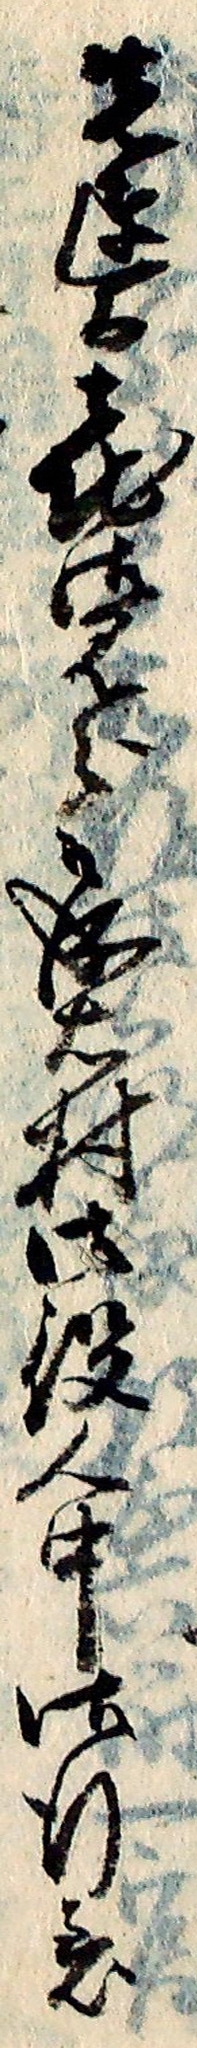先達て土地御見分被成右村御役人中御行着
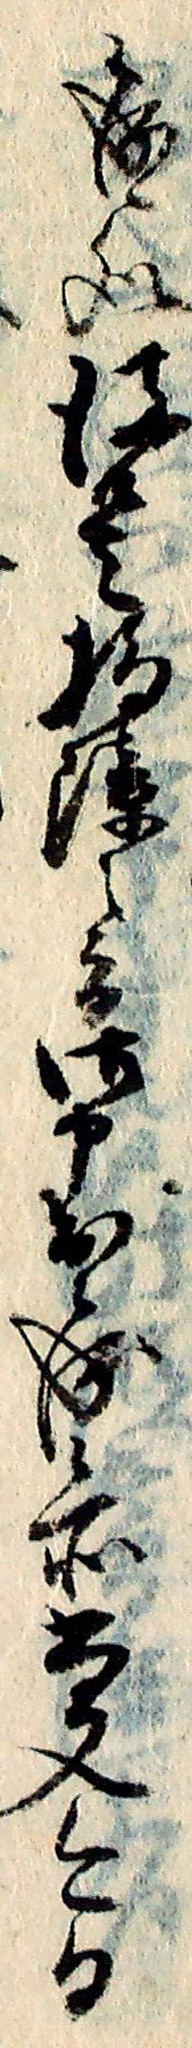被成候処彼是指障之旨御申出被成候所尚又今日
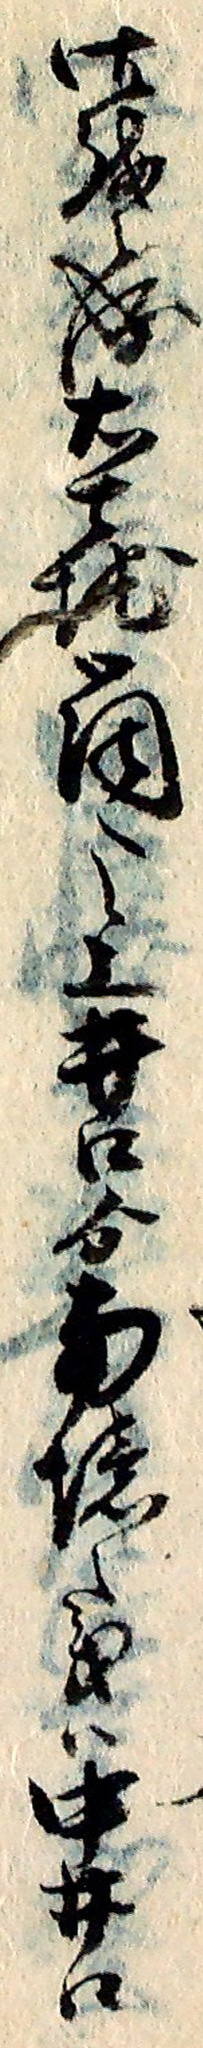御越被成右土地御調へ之上井口ゟ南境之義は中井口
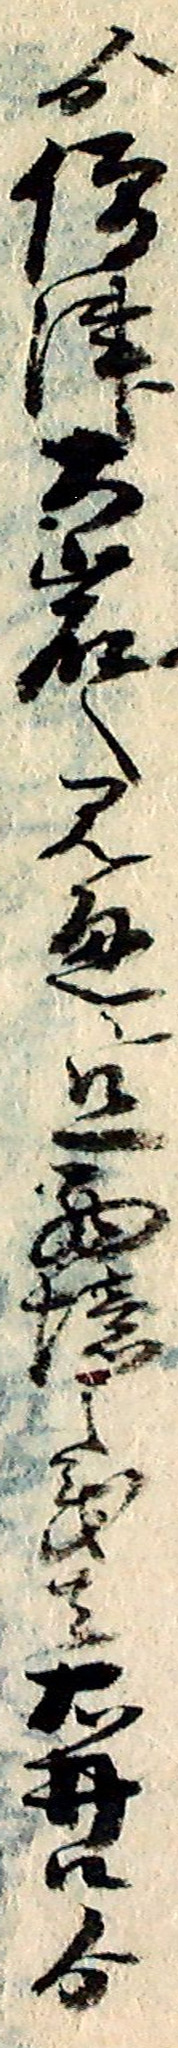ゟ僧津大岩へ見通し且西境之義は右井口ゟ
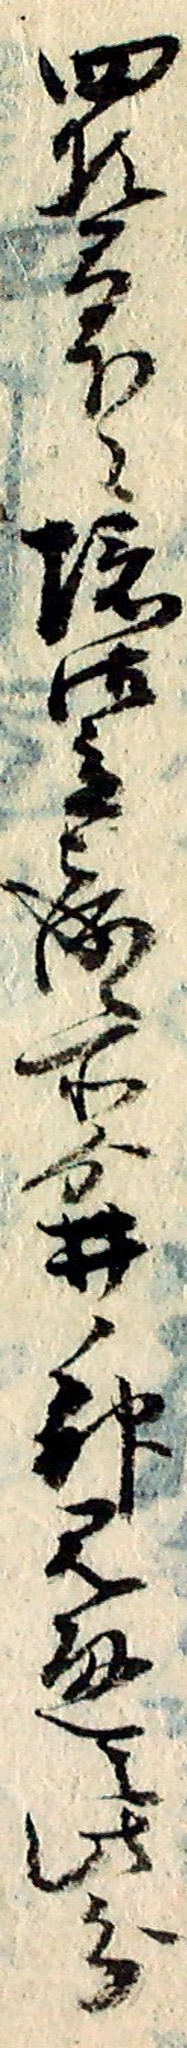四拾間下に境御立被成候所ゟ井ノ神見通し此分
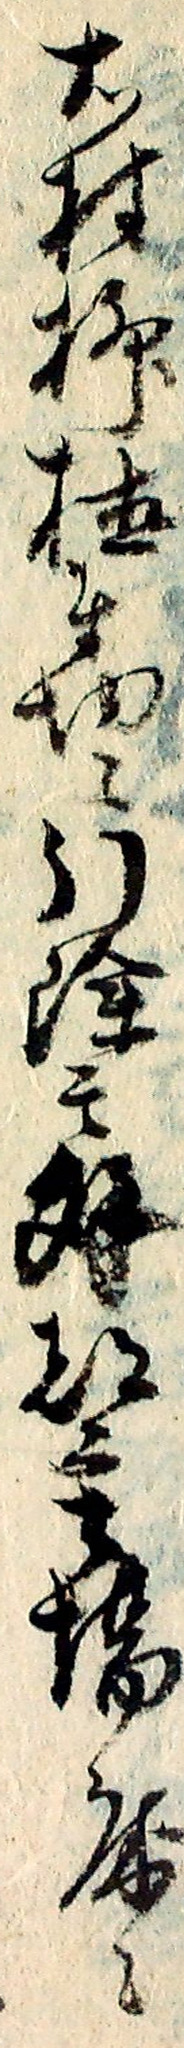右村柳植付切に引除其外都て土場床に
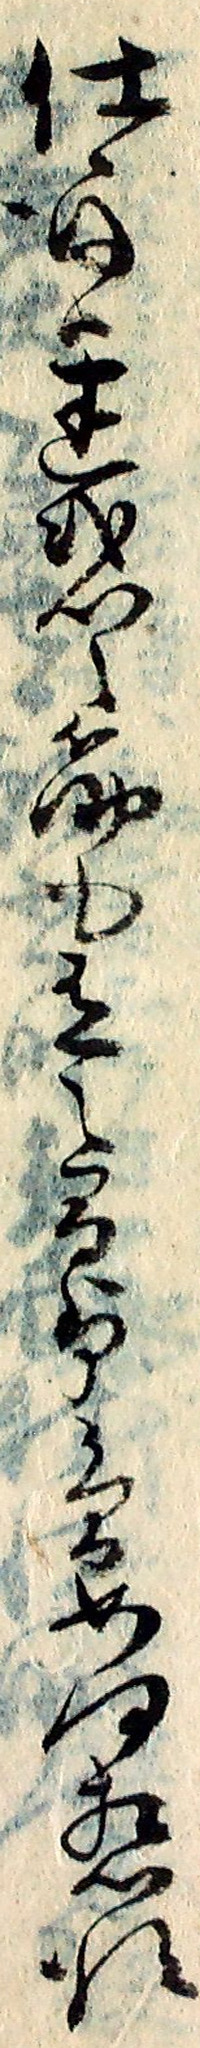仕候得は迷惑之筋も有之間布候間如何相心得
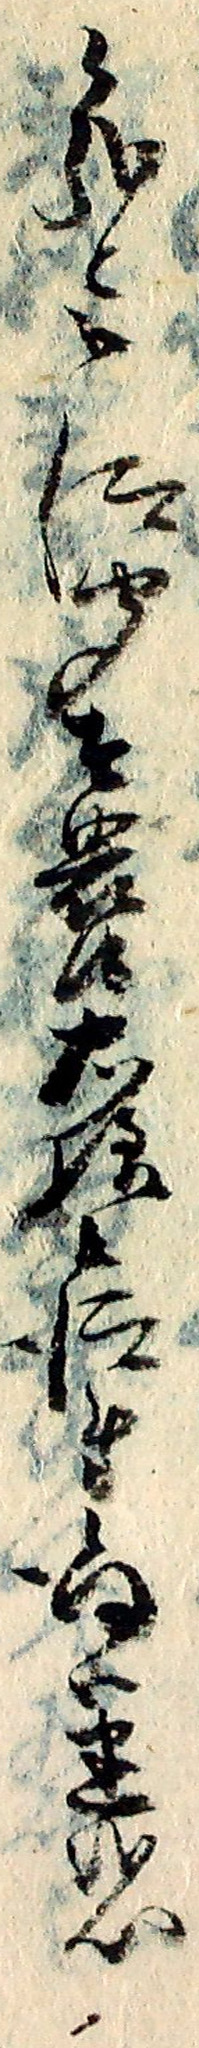候哉と被仰聞奉畏候右様被仰付候得は迷惑
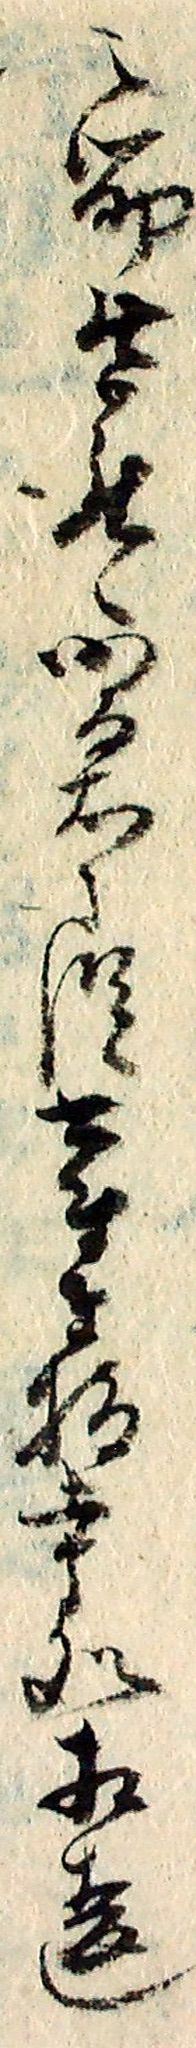之筋無御座候仍て右之段書付奉指上申候処相違
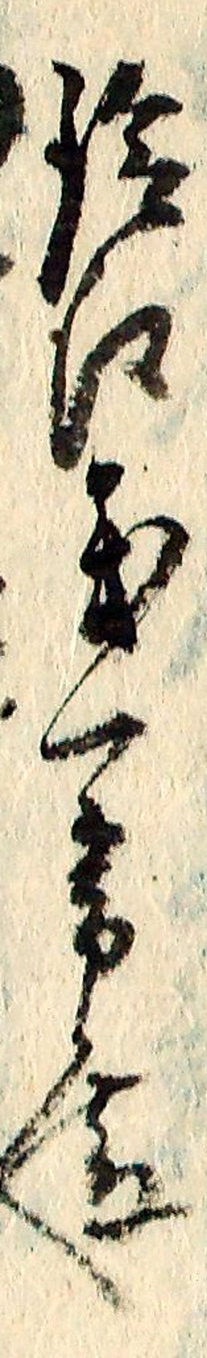鈴江義一郎殿

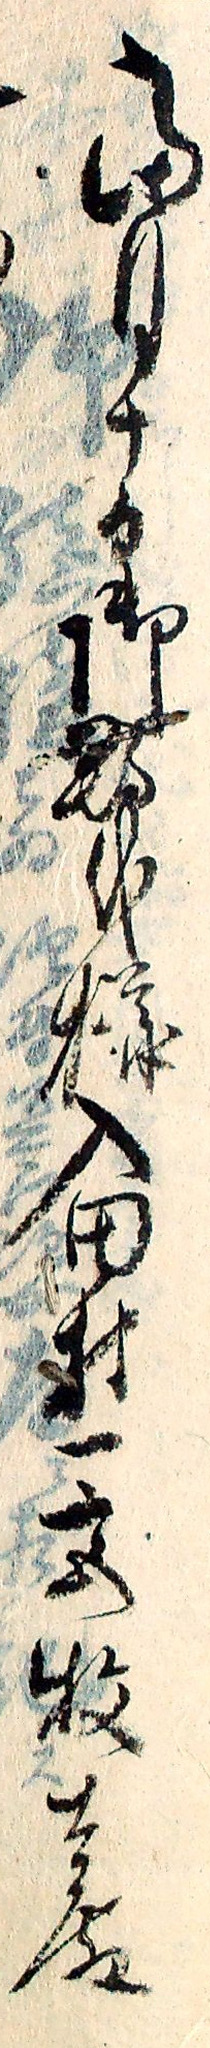当月十日御郡代様入田村一宮牧大殿
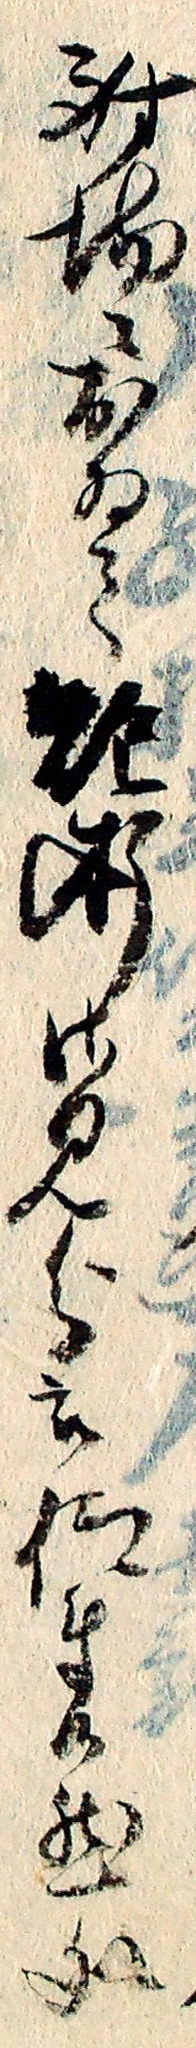射場におゐて炮術御見分被仰付候然処
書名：諸御願書控(後藤氏壱番）
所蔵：鳴門教育大学 Naruto University of Education
